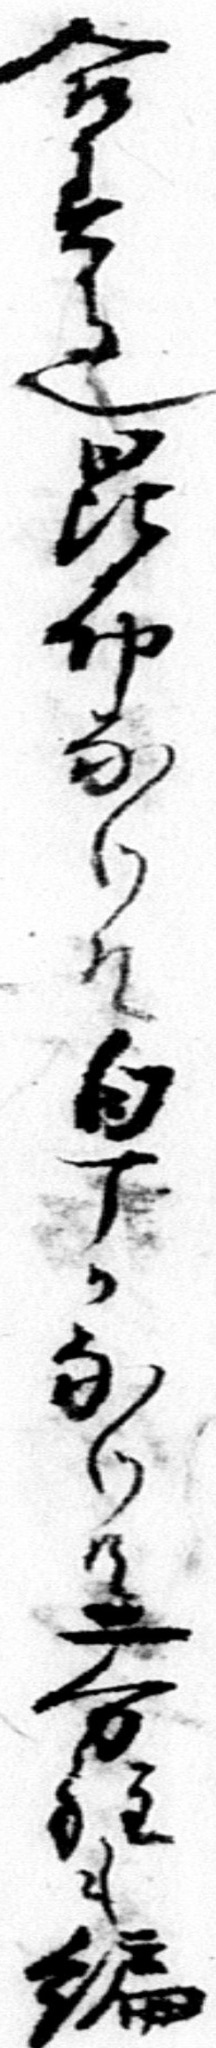合する也昆布なり共白丁かなり共二分程も編
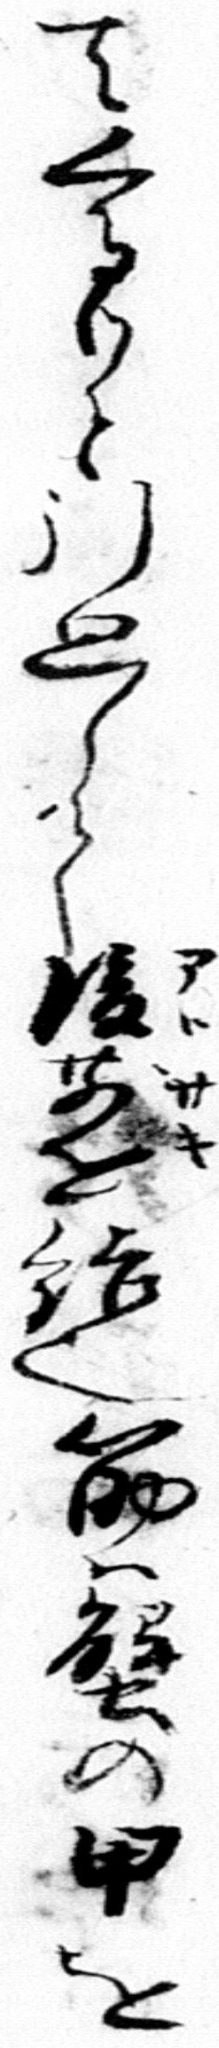てくるりと引廻して後前を結也筋は蟹の甲を
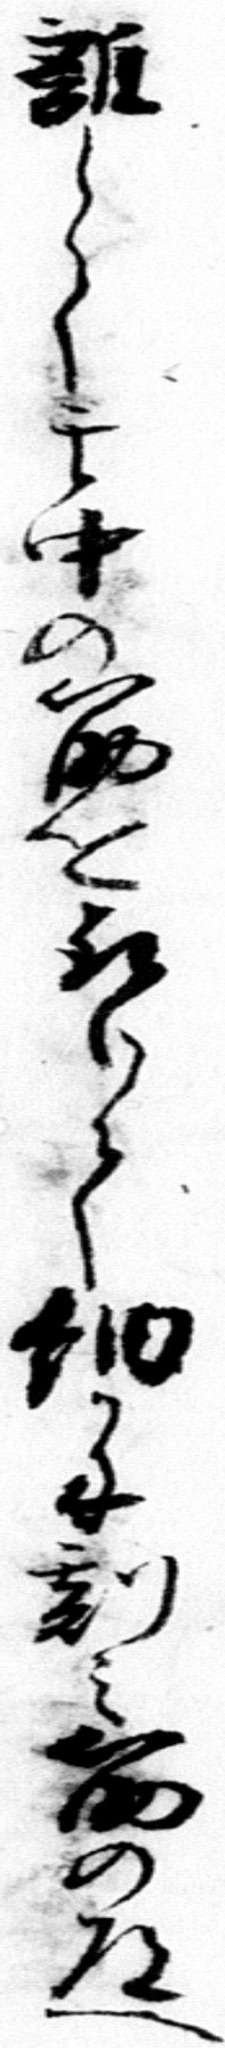離して其中の筋を取りて細かに刻み筋の道へ
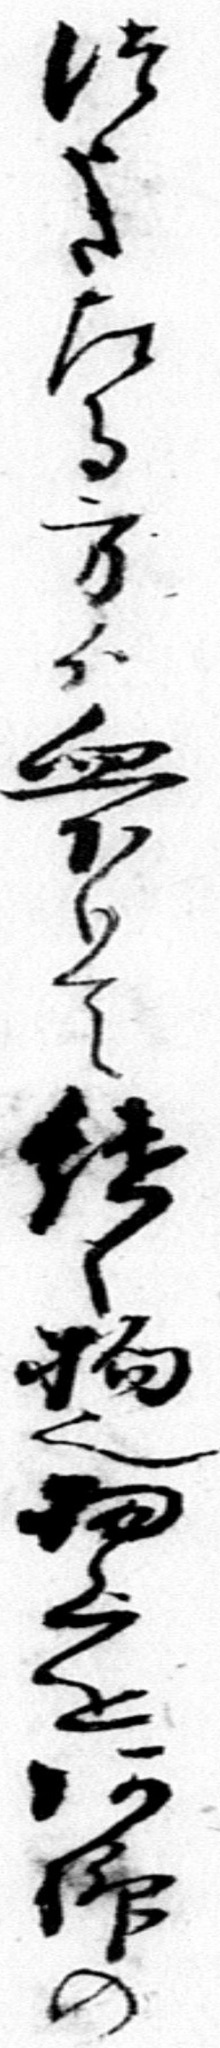つきたる方より血下りて継く物也扨上を河柳の
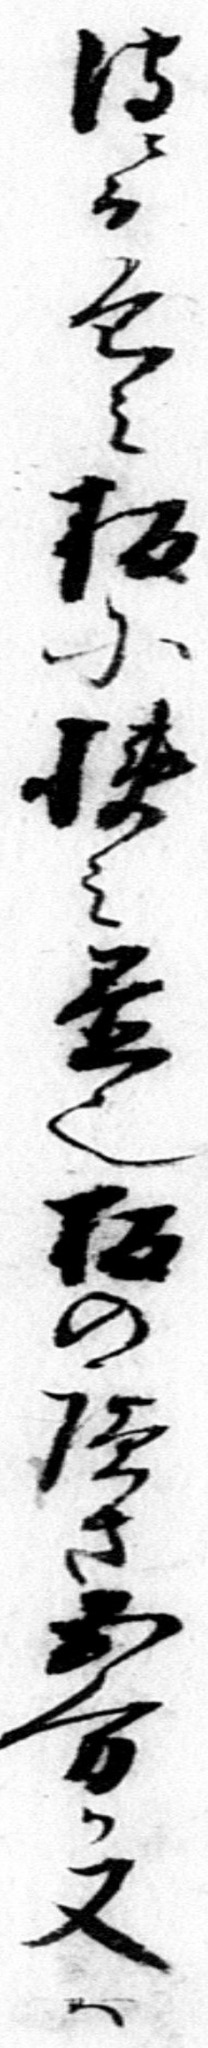皮にて包み板に挟み置也板の広さ五分か又は
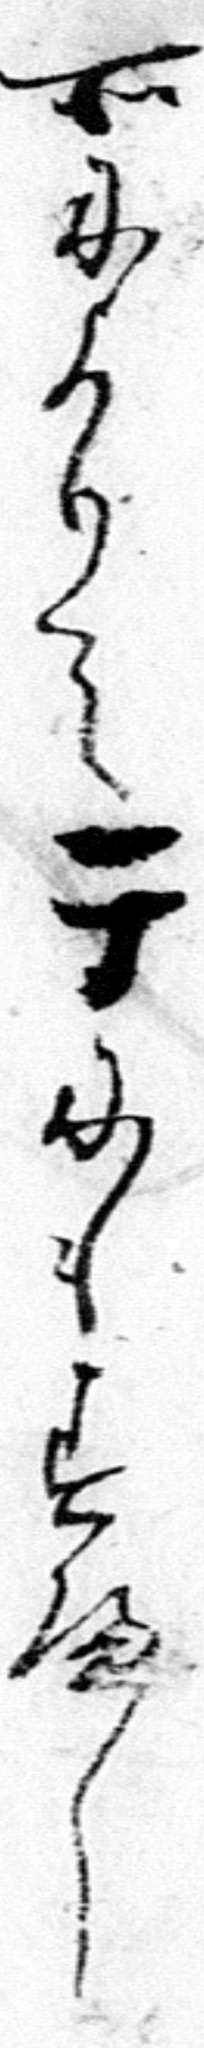所によりて一寸にもすへし
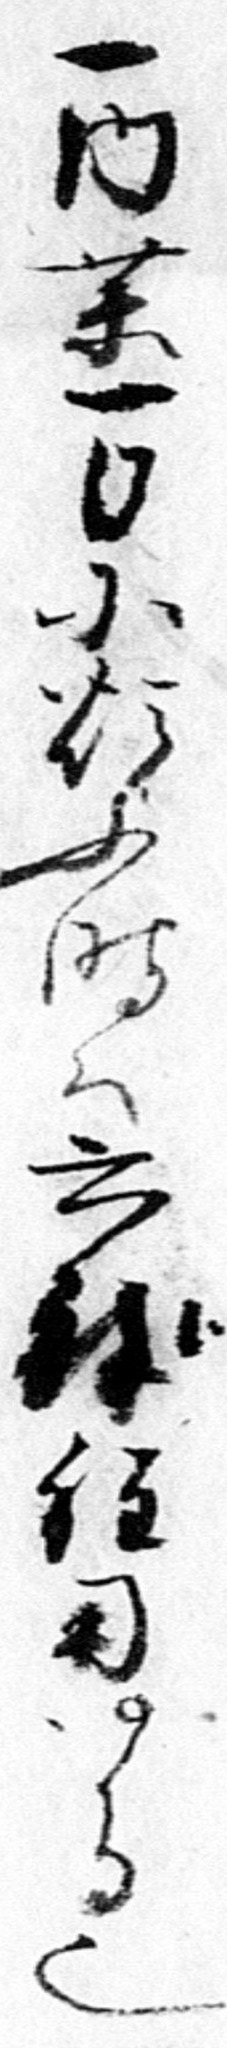一内薬一日に煩ふ時は六度程用いる也
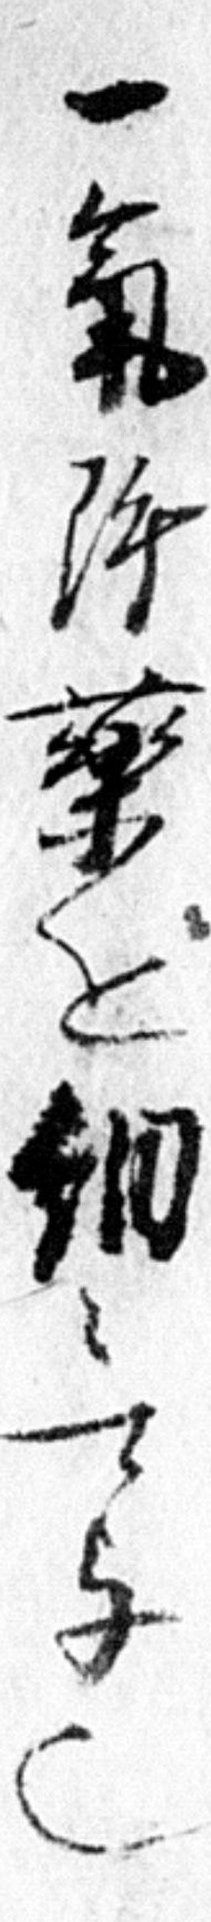一気付薬を細々可与也
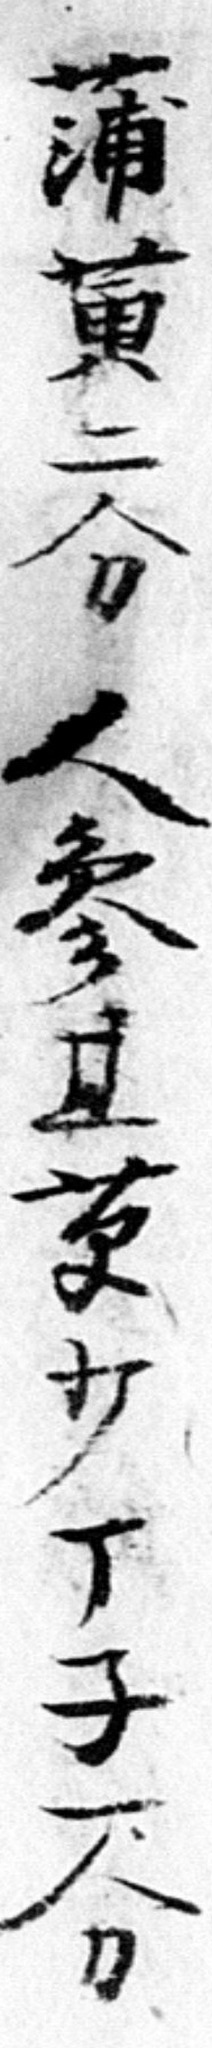蒲黄二分人参甘草少丁子一分
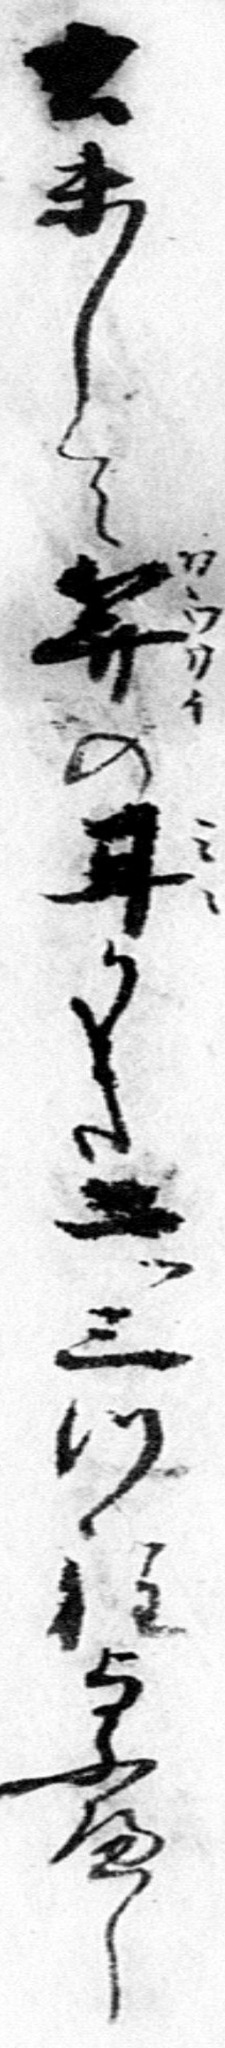右まして笄の耳かき二つ三つ程与ふへし

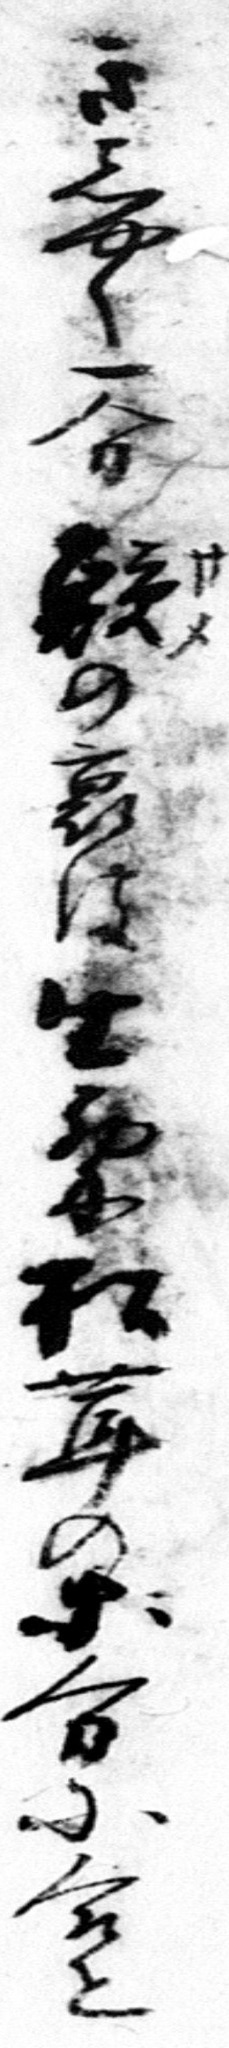きしやく一分鮫の裏皮生栗松茸の等分に合せ
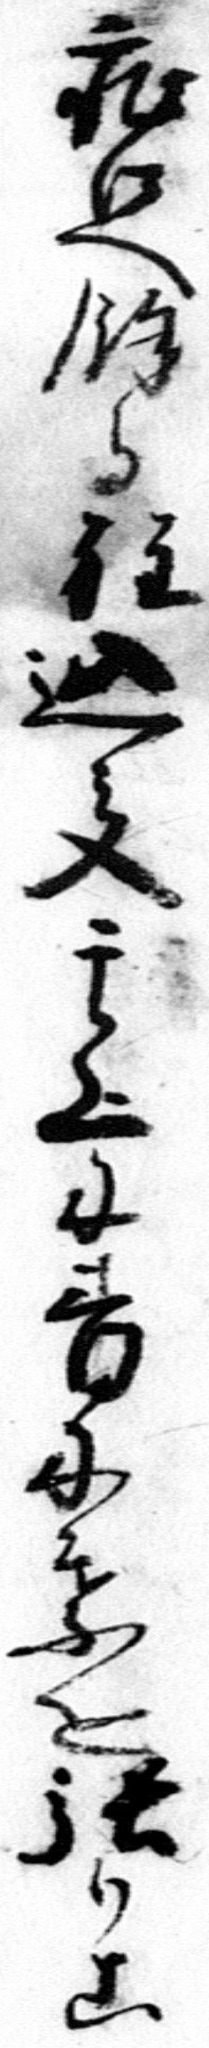疵口へ余る程込み入其上に青木葉を張りこ
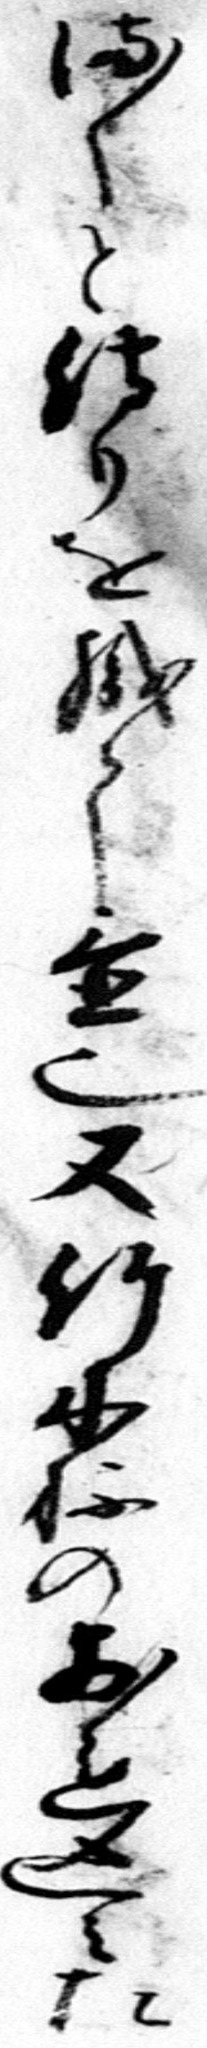ま〳〵と縛りを掛て置也又竹木抔のおれ込みた
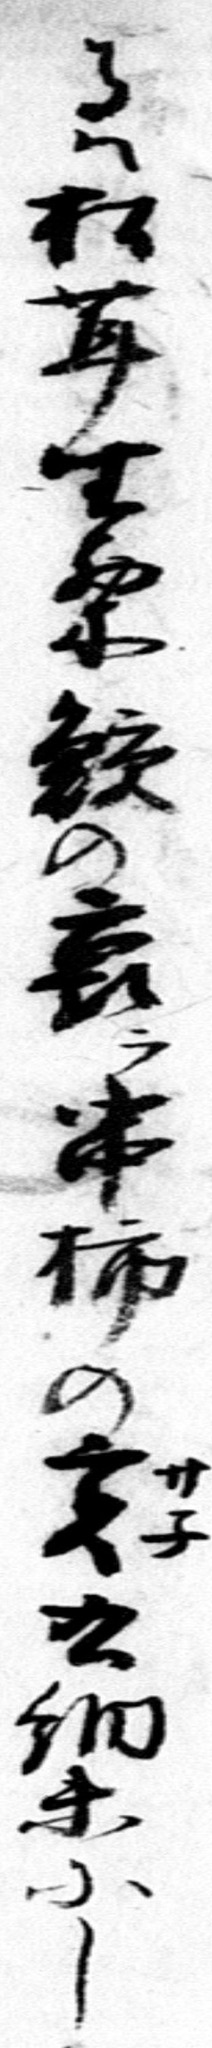るは松茸生栗鮫の裏ら串柿の亥右細末にし
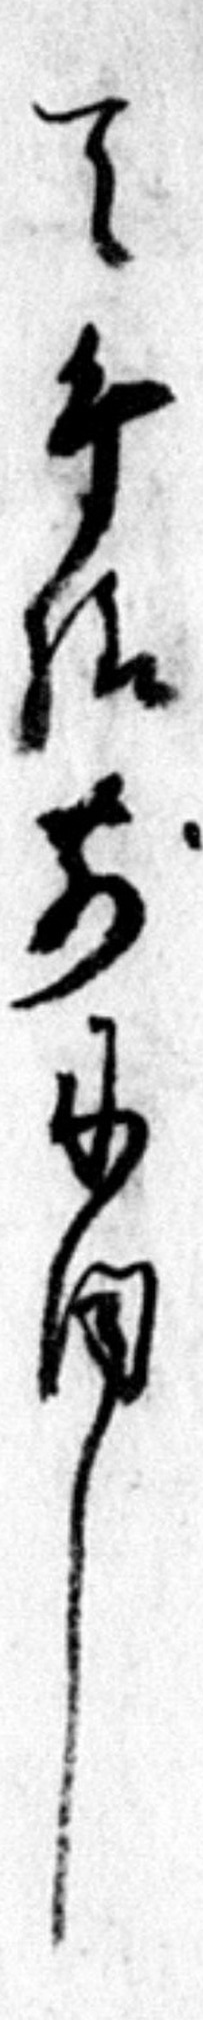て付様前に同し
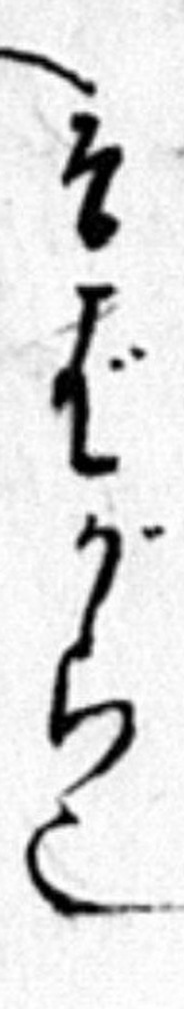そばがら也
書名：名薬秘伝之書
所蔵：徳島県立図書館
